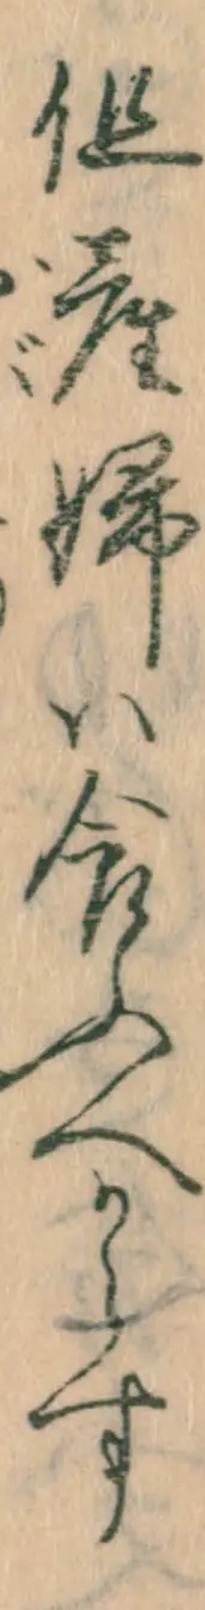但産婦は食ふへからす
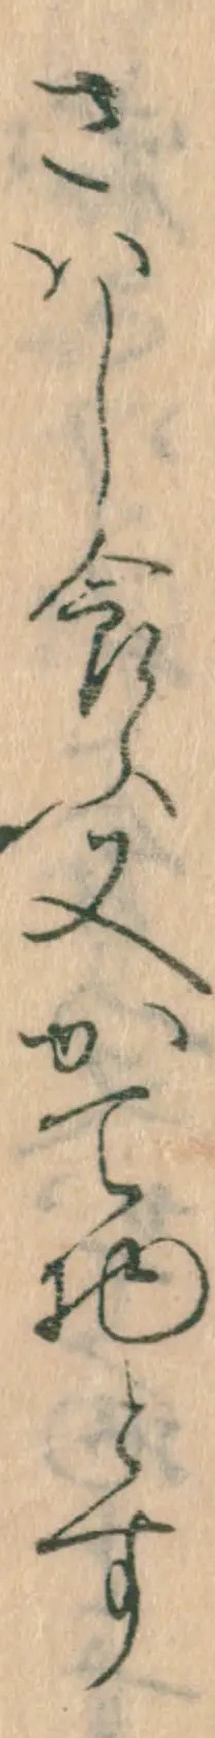さはし食ふ又かて物とす
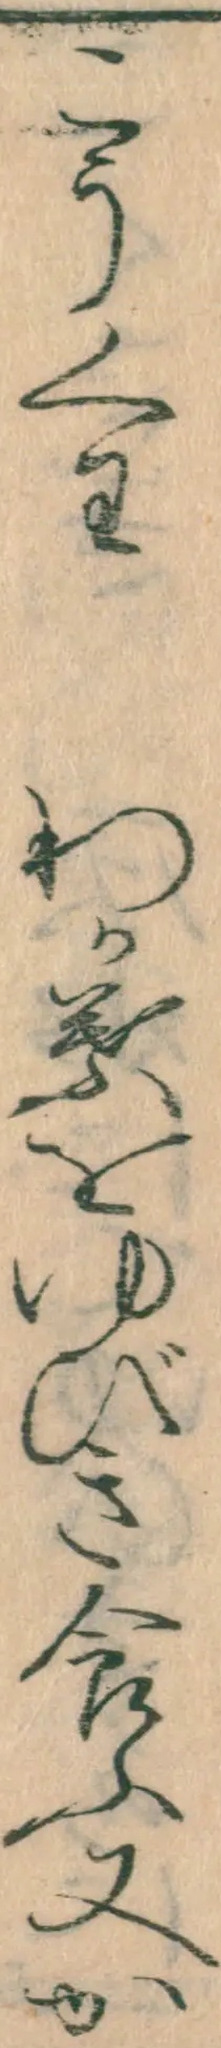こうくわわか葉をゆびき食ふ又か
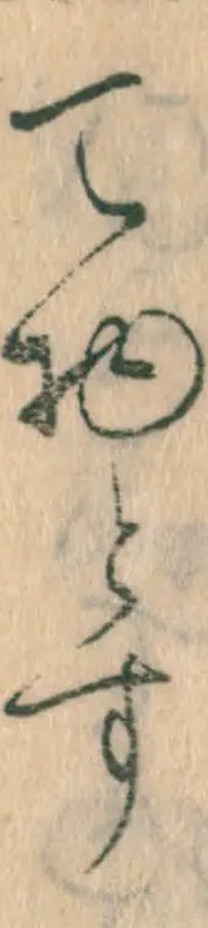て物とす
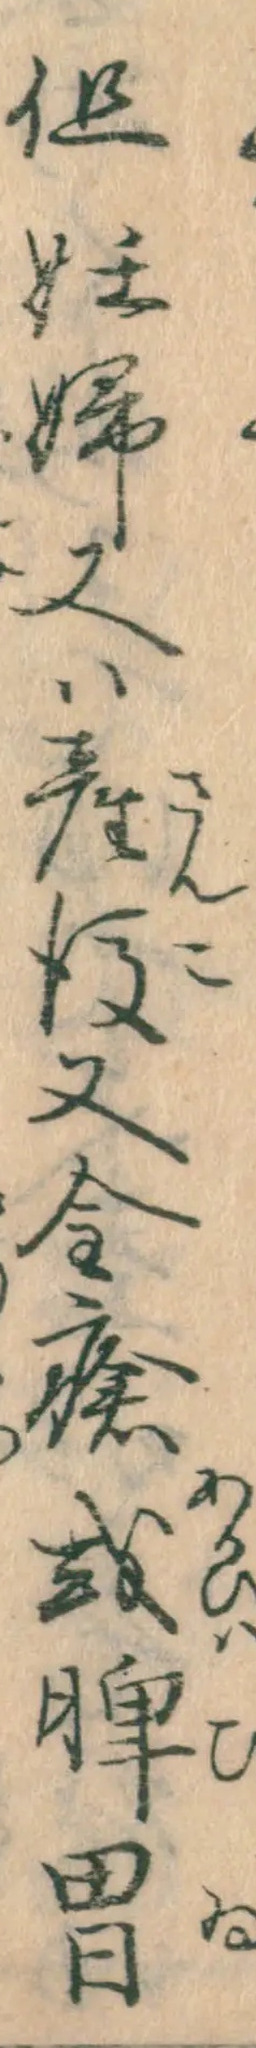但妊婦は産後又金瘡或脾胃
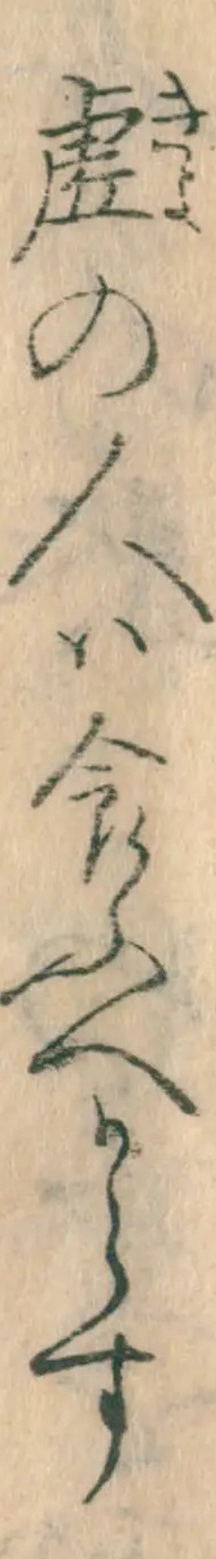虚の人は食ふへからす

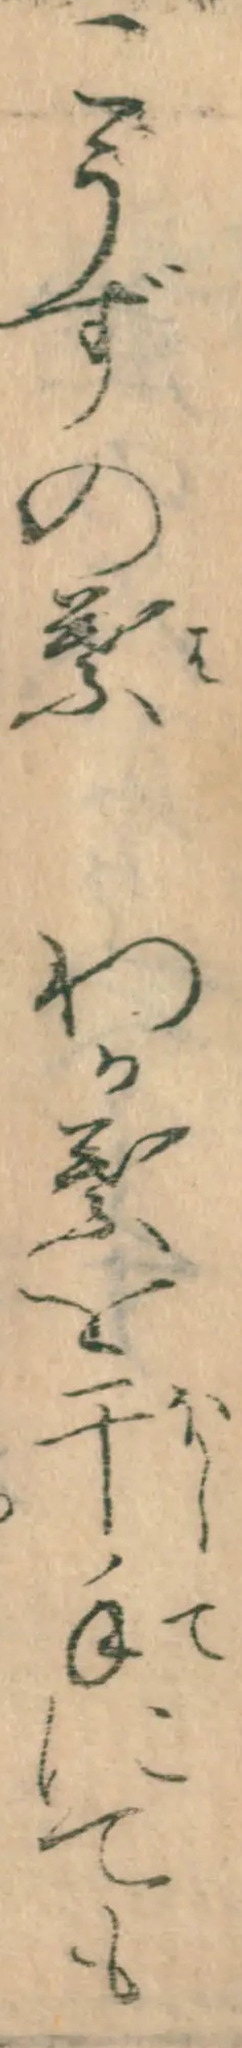こうずの葉わか葉を干手にても
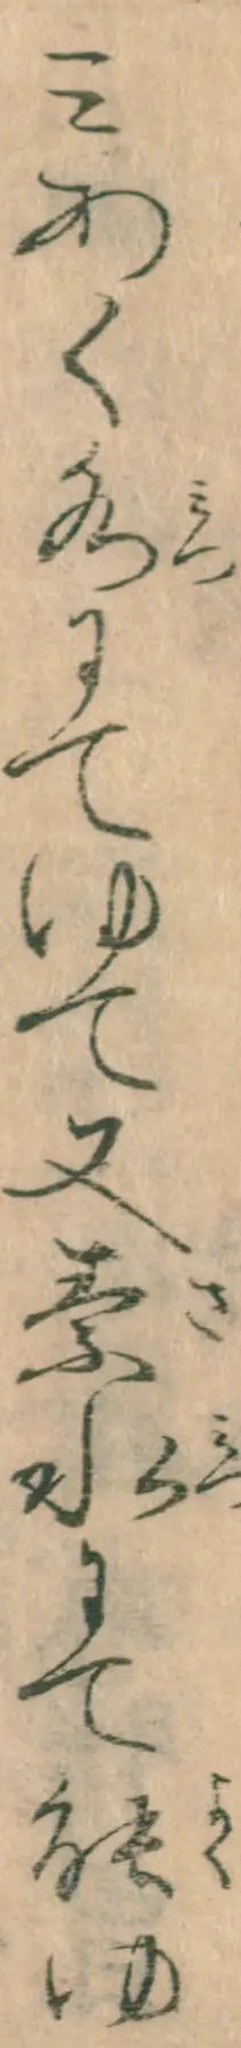みあく水にてゆて又素水にて能ゆ
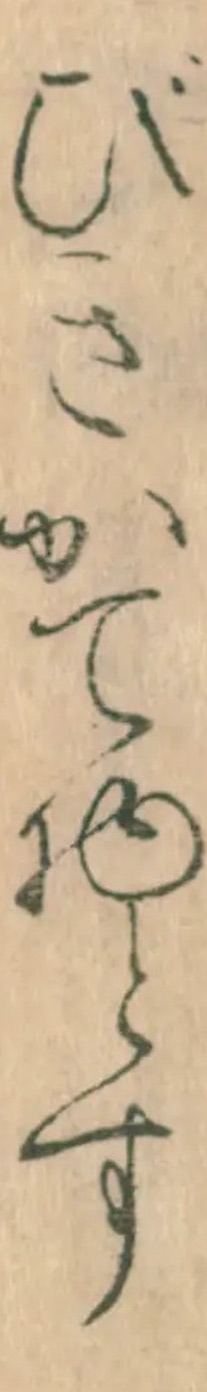びきかて物とす
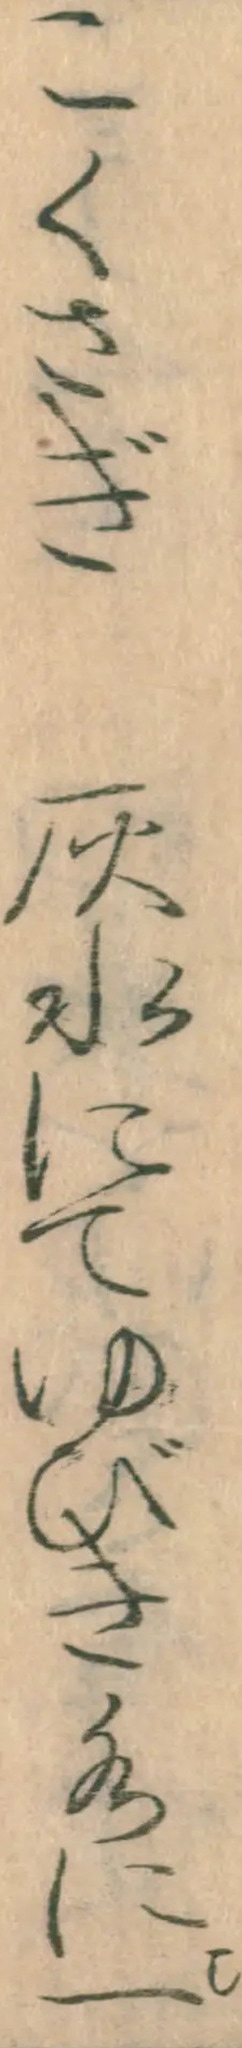こくさぎ灰水にてゆびき水に一
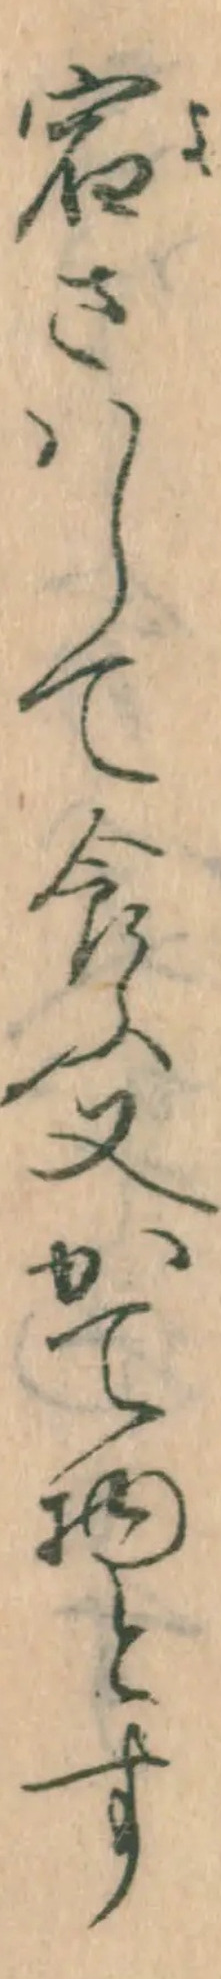宿さはして食ふ又かて物とす
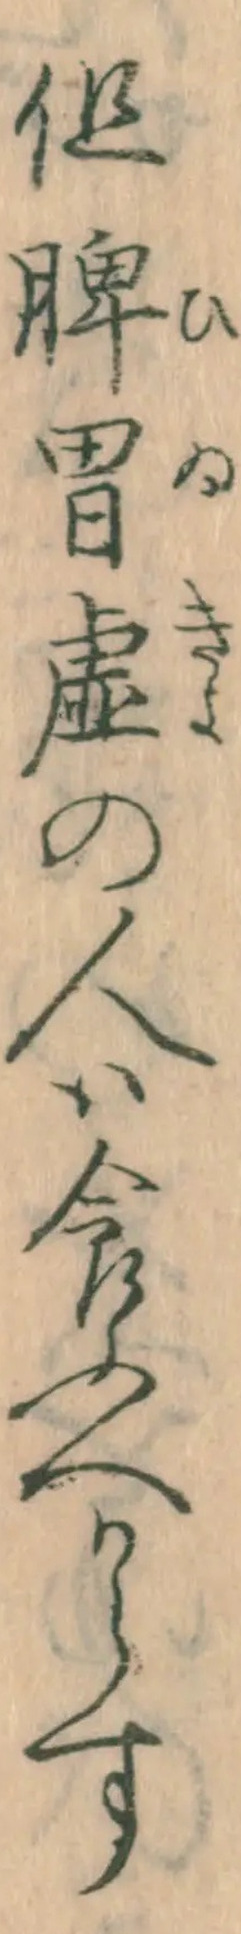但脾胃虚の人は食ふへからす
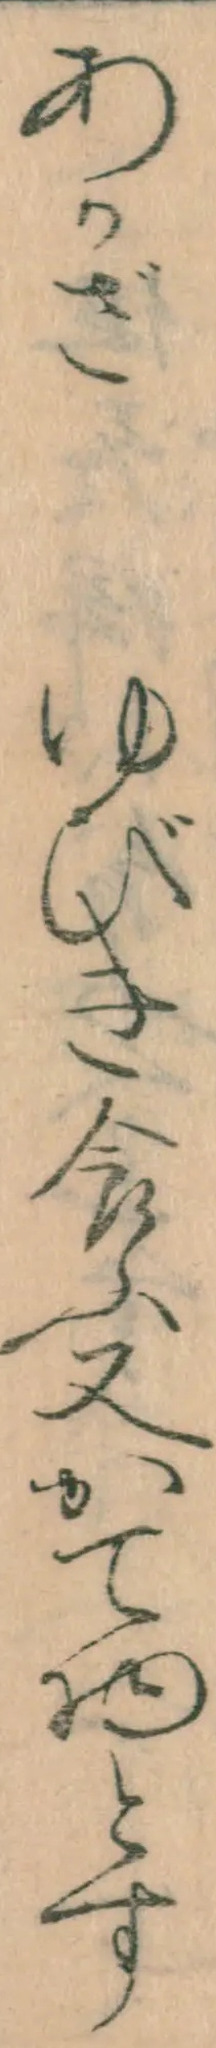あかざゆびき食ふ又かて物とす
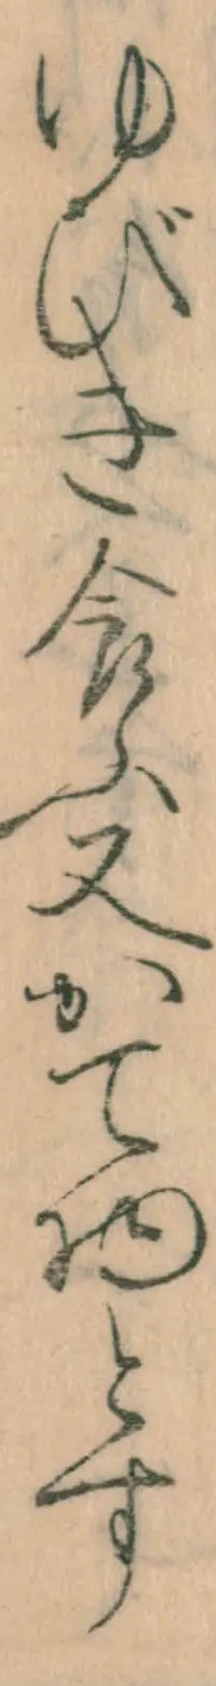びき食ふ又かて物とす
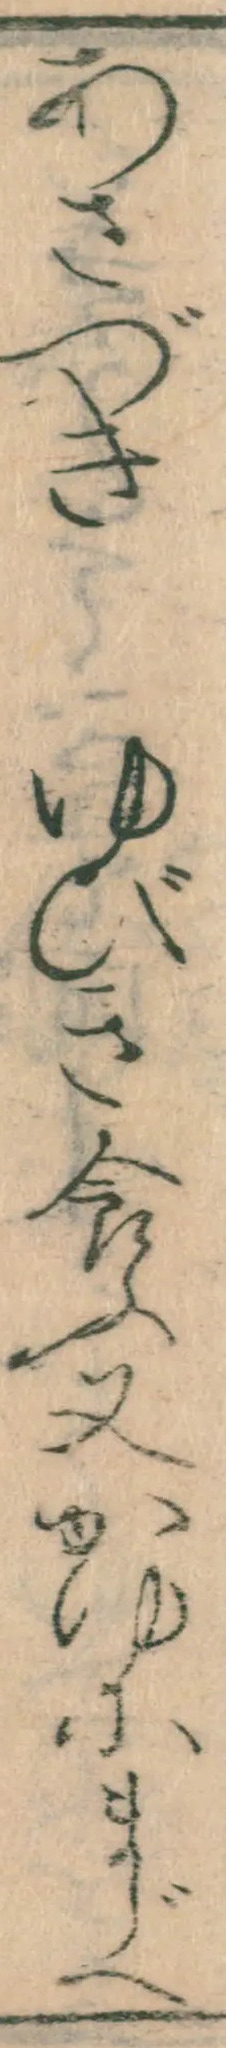あさづきゆびき食ふ又かゆにまじへ
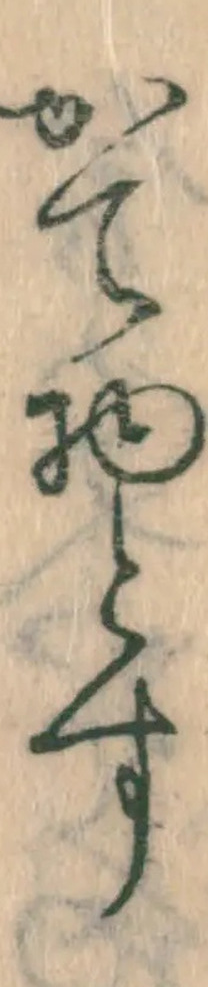かて物とす
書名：かてもの
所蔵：国立国会図書館 National Diet Library, JAPAN
